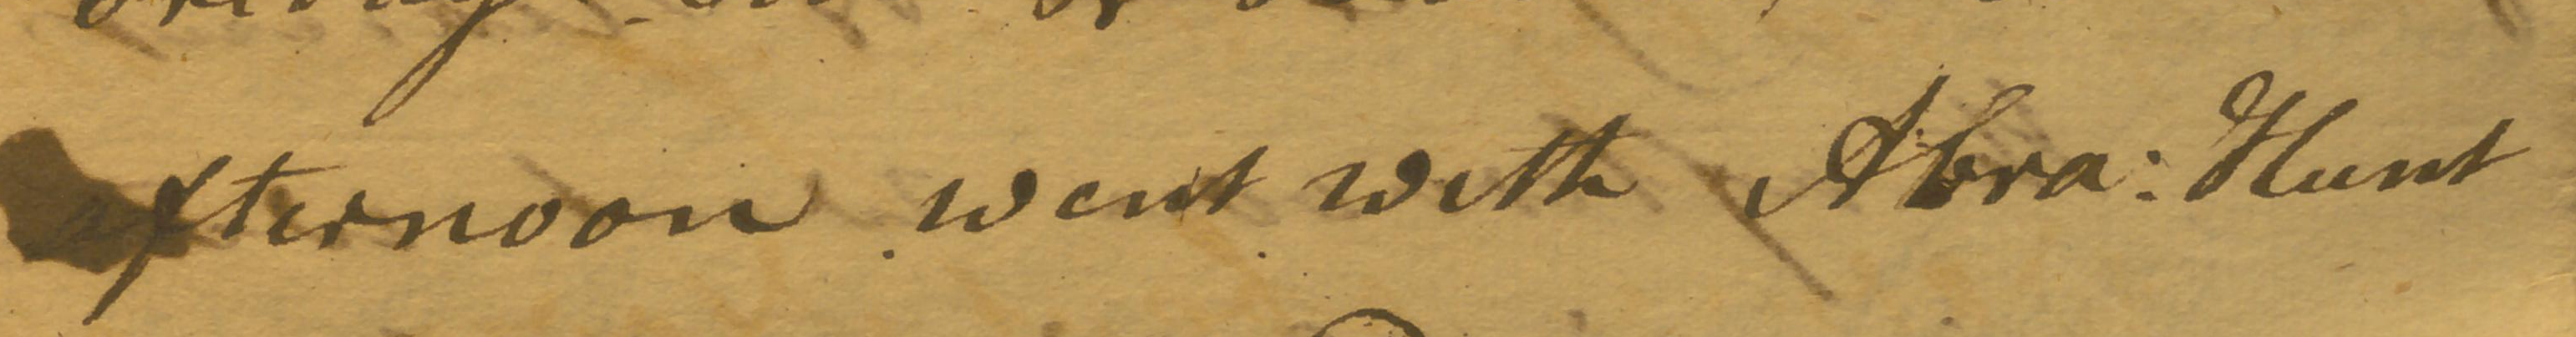afternoon went with Abra: Hunt
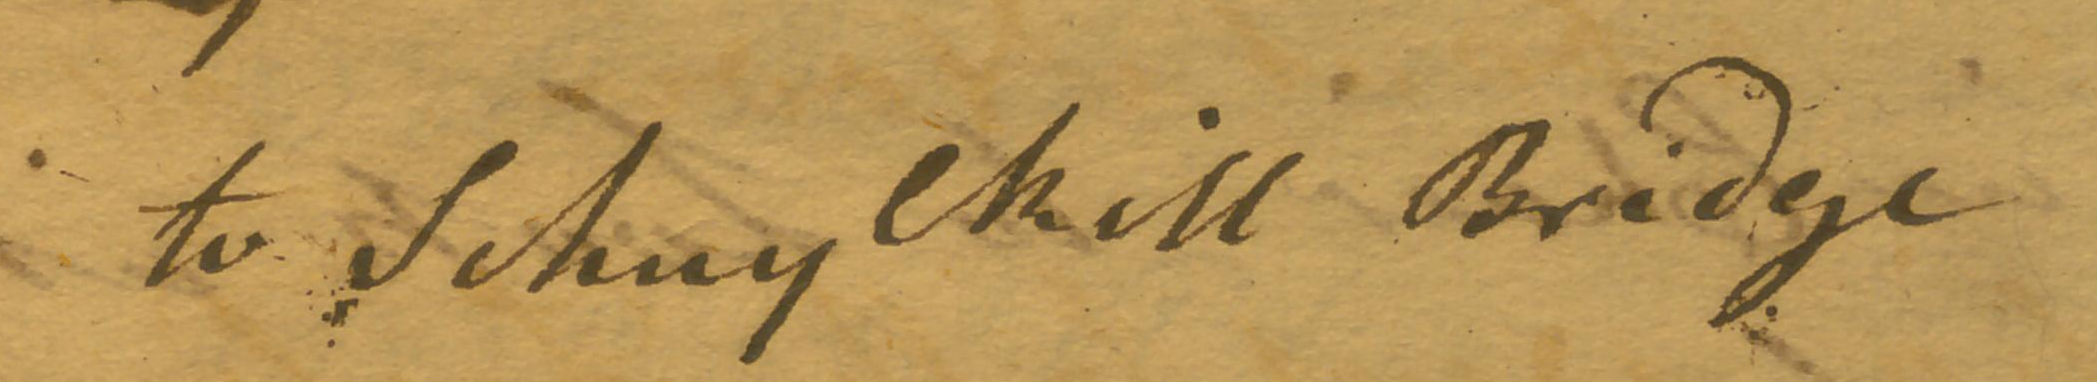to Schuylkill Bridge
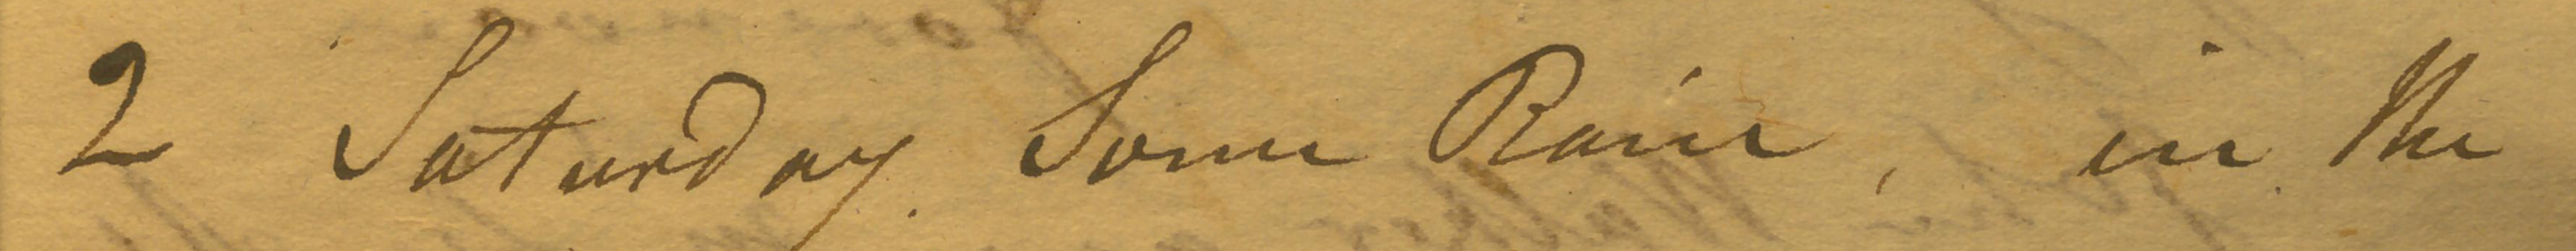2 Saturday some Rain, in the
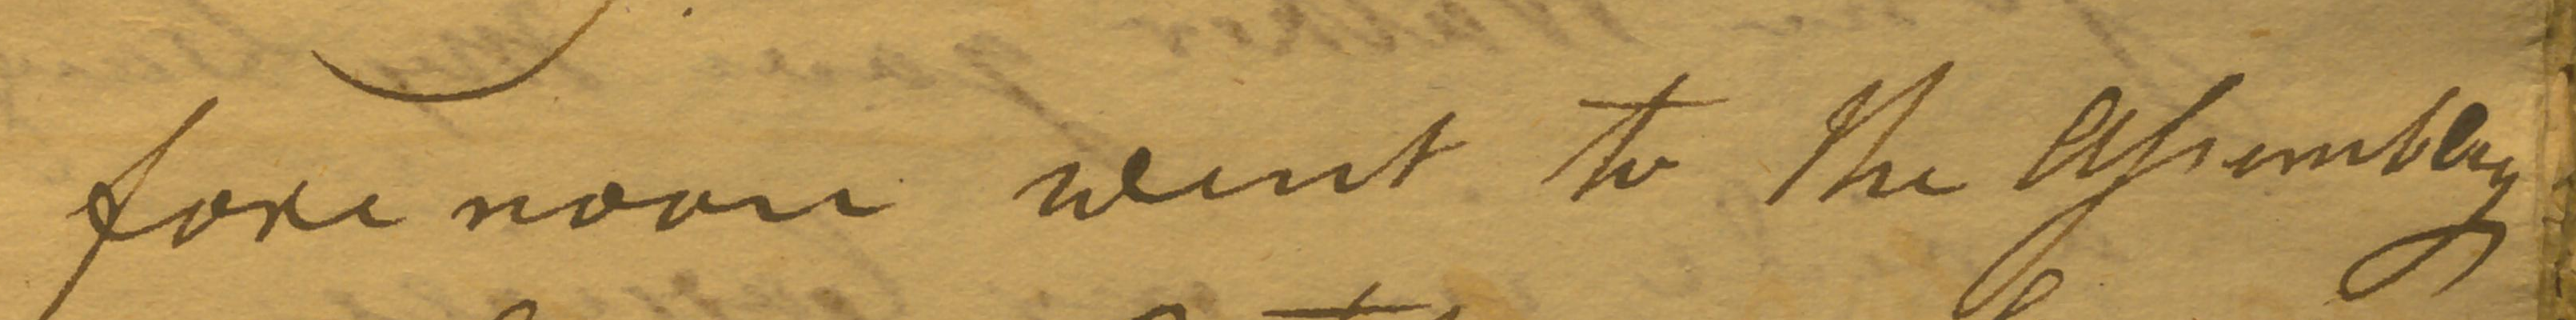fore noun went to the Assembley
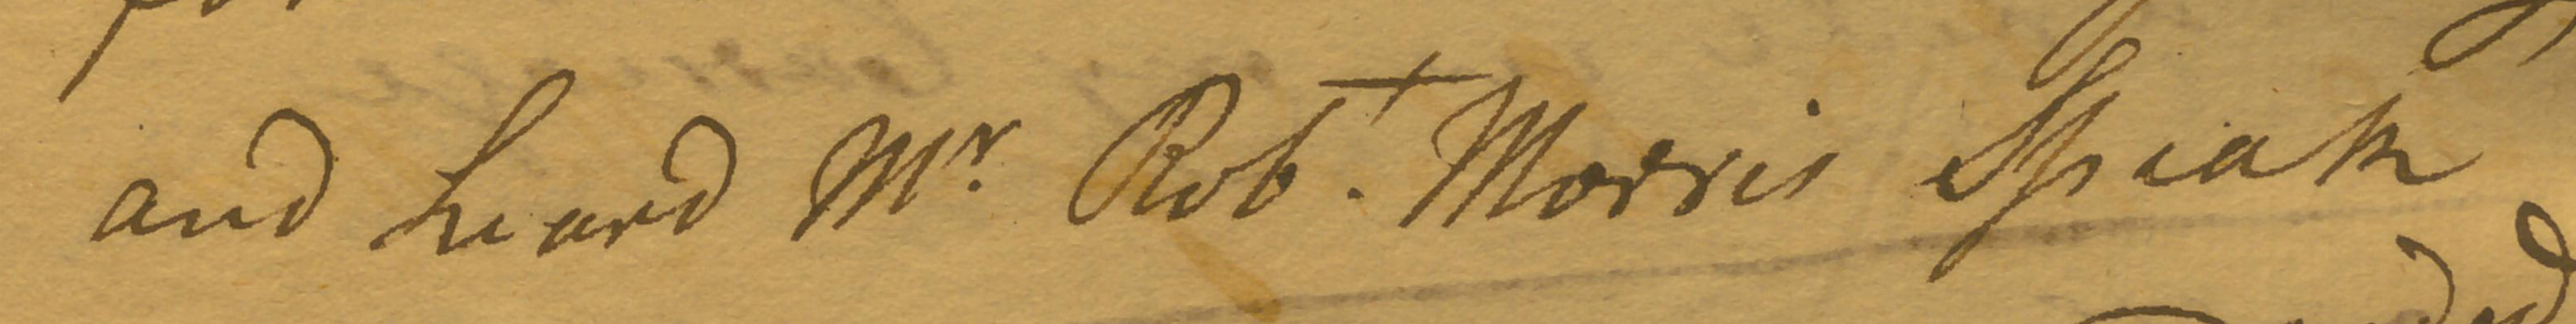and heard M^r. Rob^t. Morris Speak
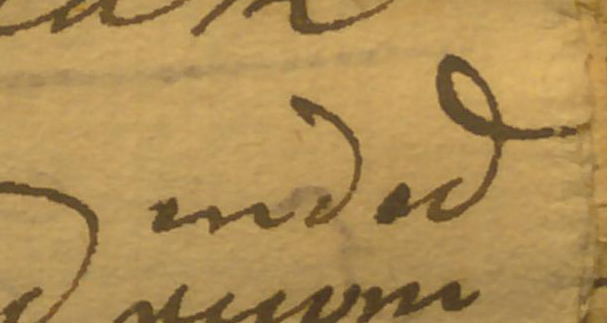ended
